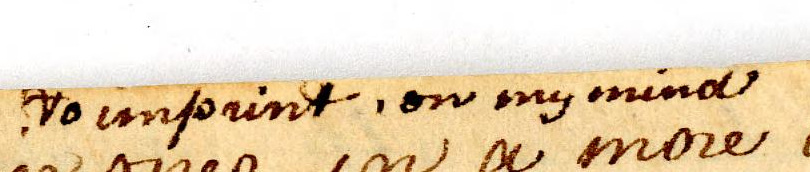to imprint on my mind
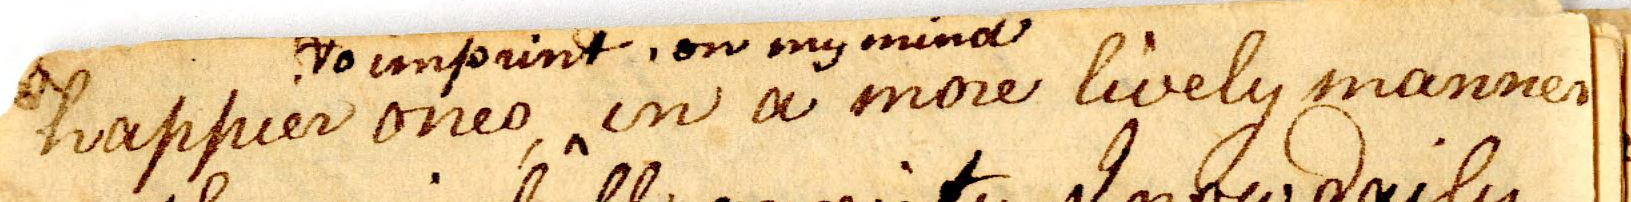happier ones, ^ in a more lively manner
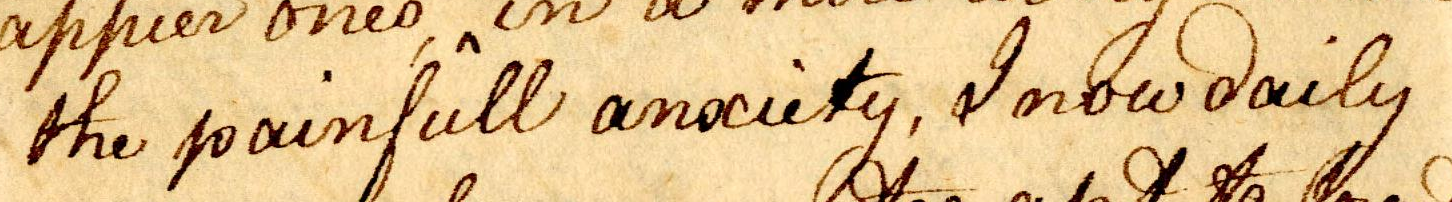the painfull anxiety, I now daily
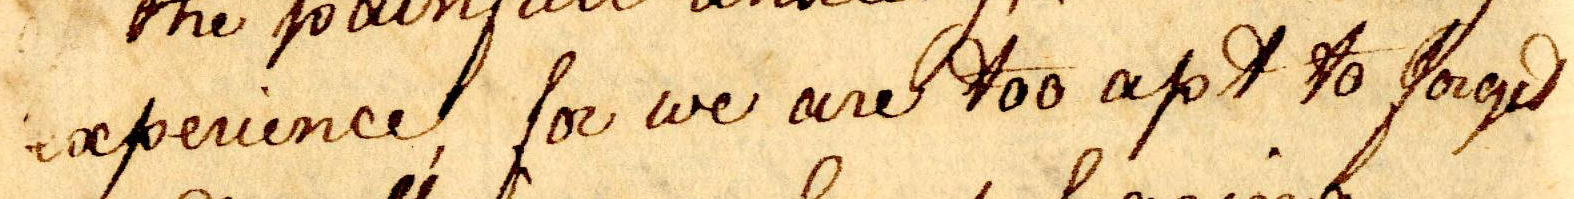experience, for we are too apt to forget
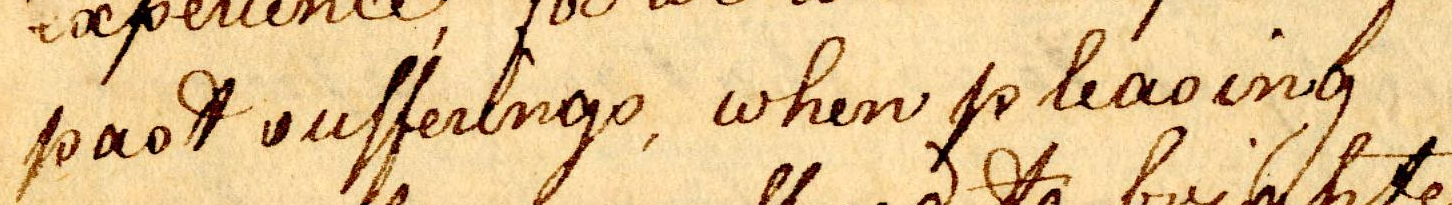past sufferings when pleasing
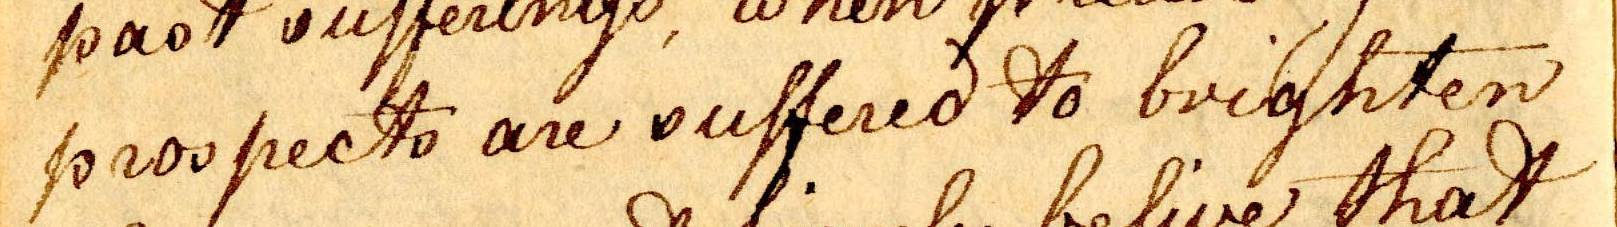prospects are suffered to brighten
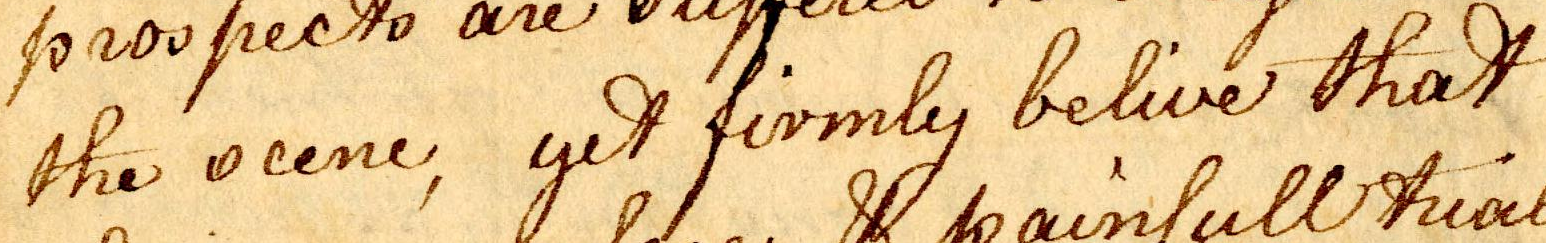the scene, yet firmly belive that
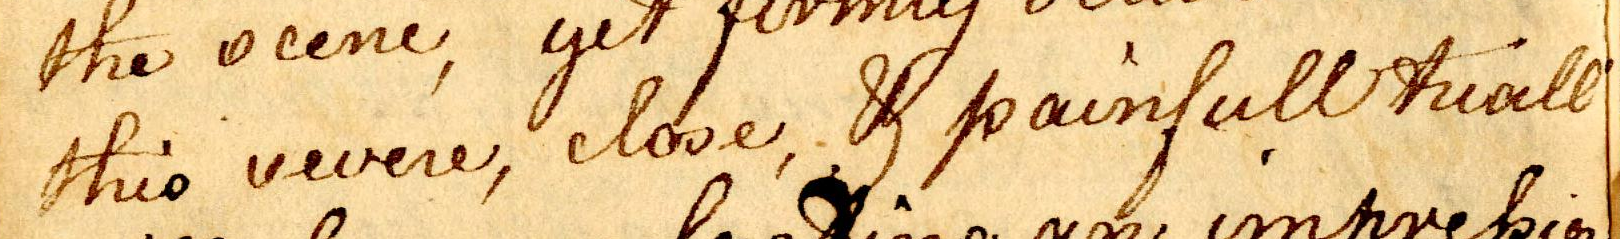this severe, close, & painfull triall
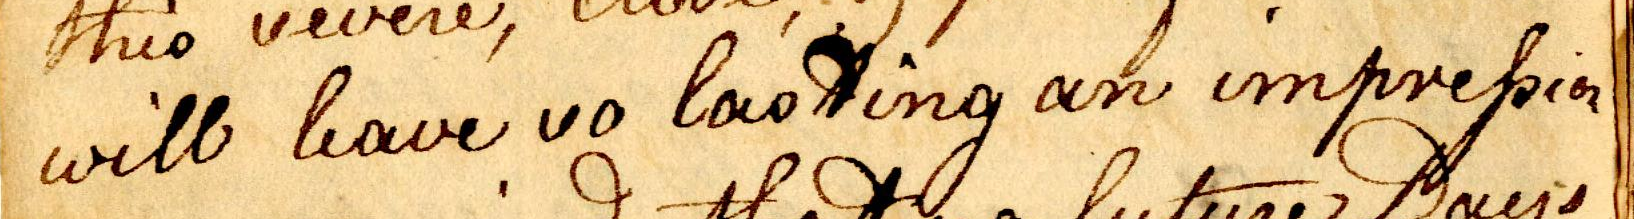will leave so lasting an impression
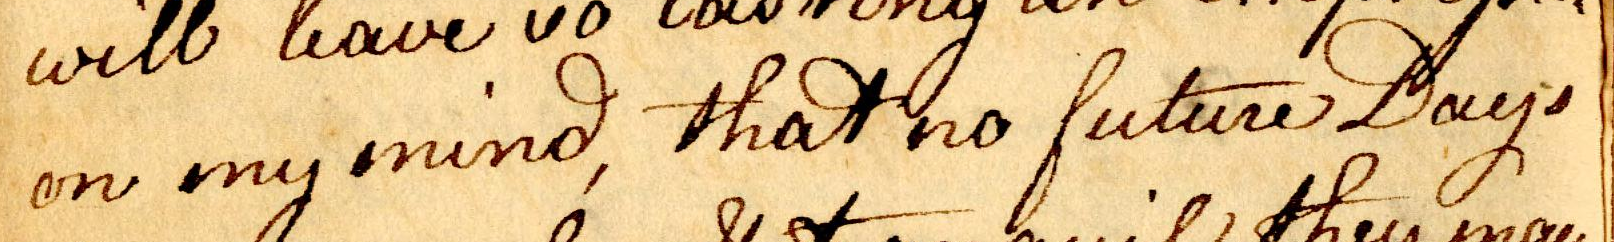on my mind that no future Days
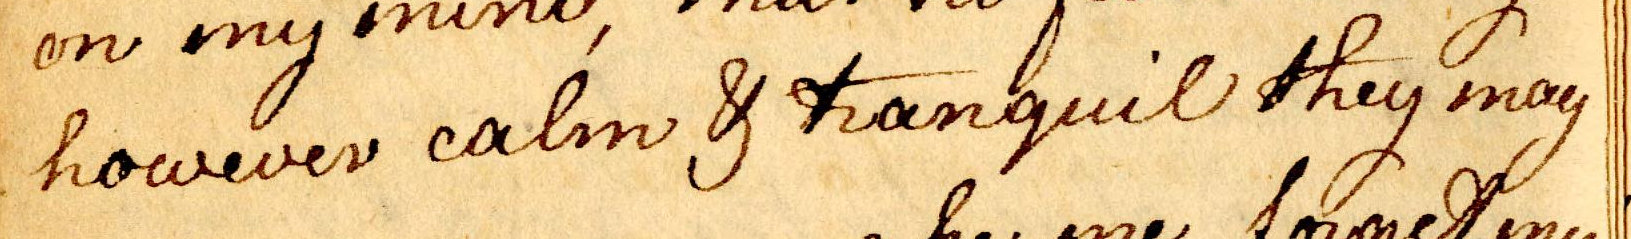however calm & tranquil they may
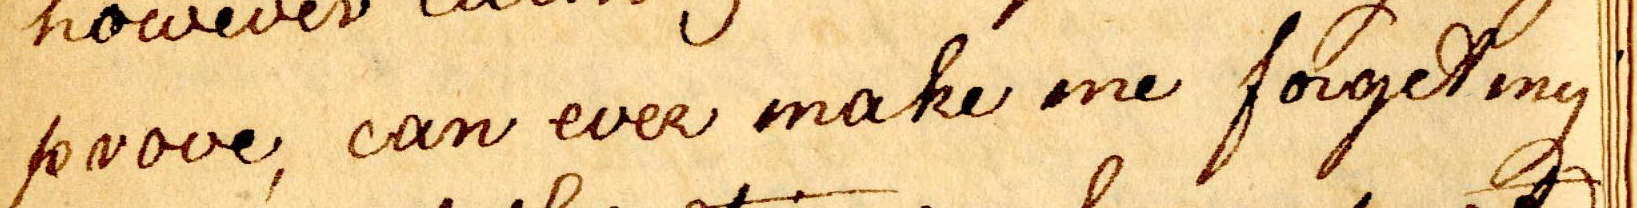prove can ever make me forget my
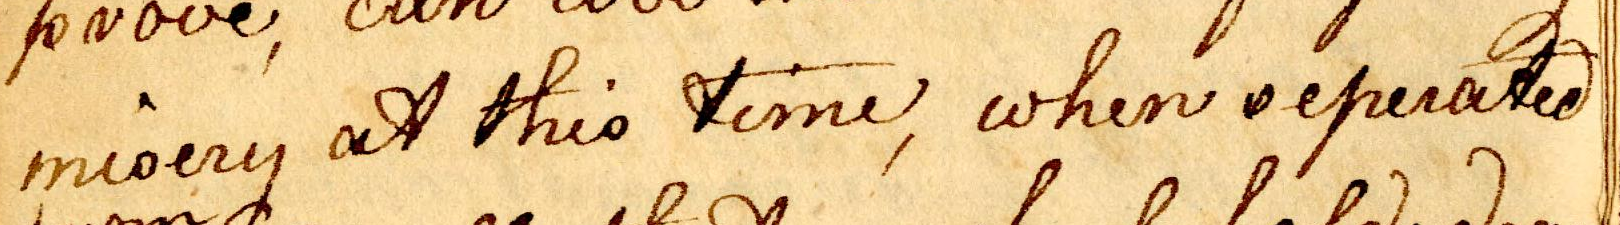misery at this time, when seperated
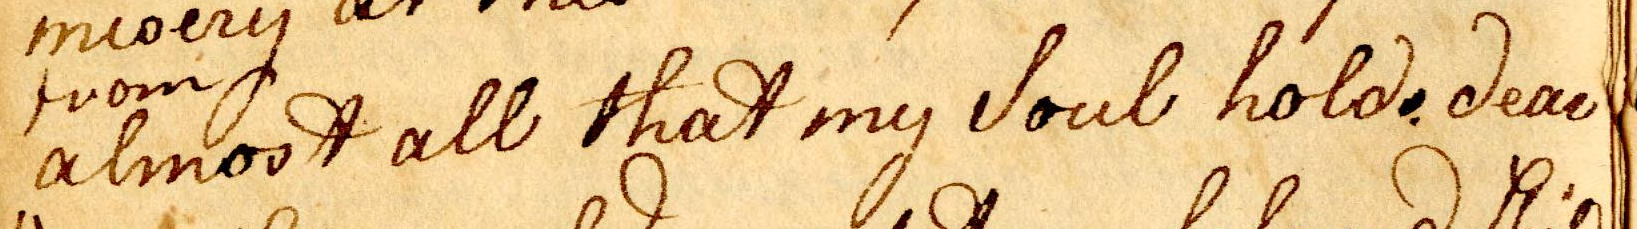almost all that my Soul holds dear
